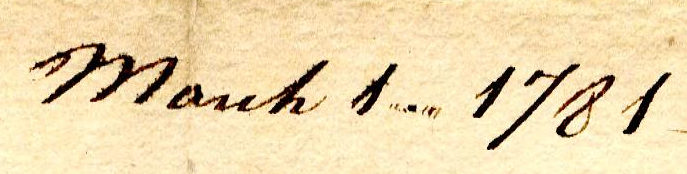March 1. 1781
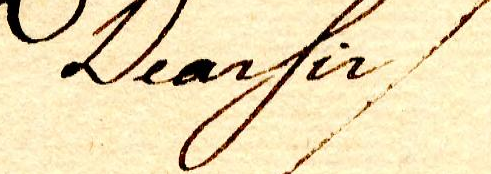Dear Sir
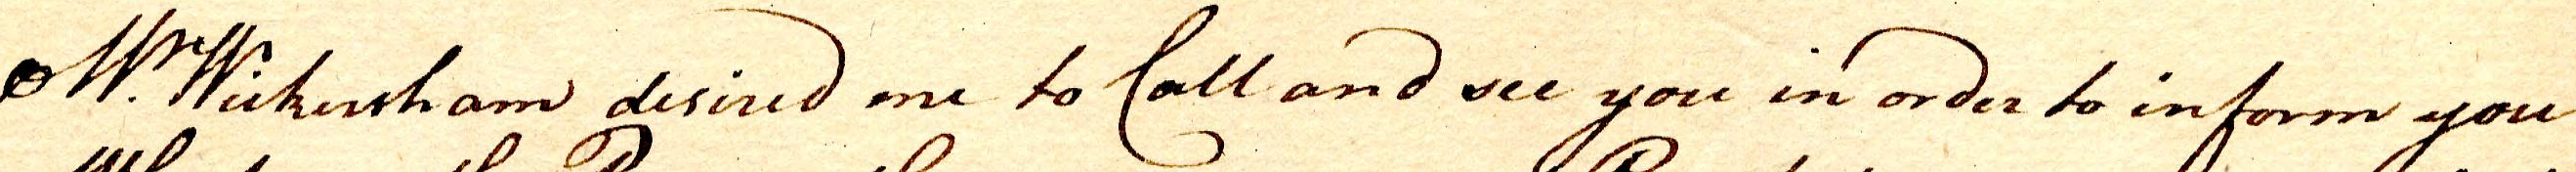M^r. Wickersham desired one to Call and see you in order to inform you
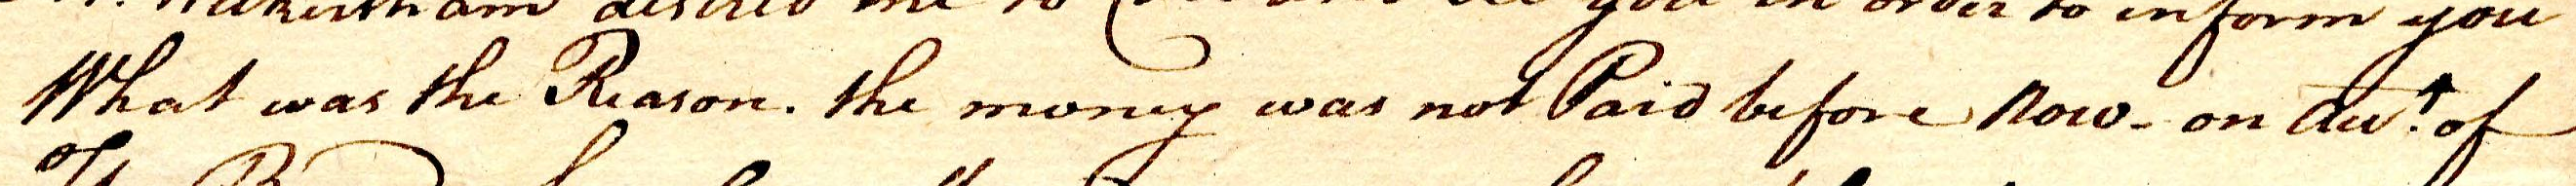What was the Reason. the money was not Paid before Now on Acc^t. of
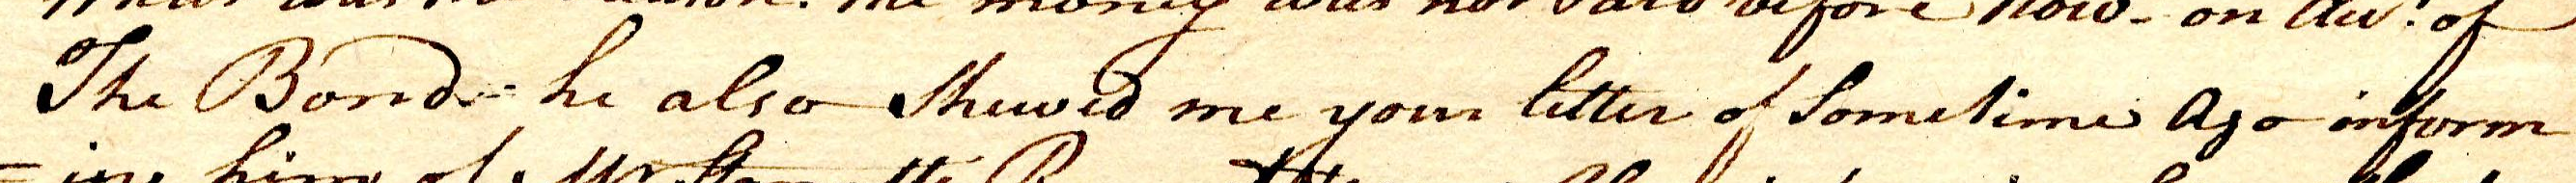The Bonds he also shewed me your letter of Sometime ago inform-
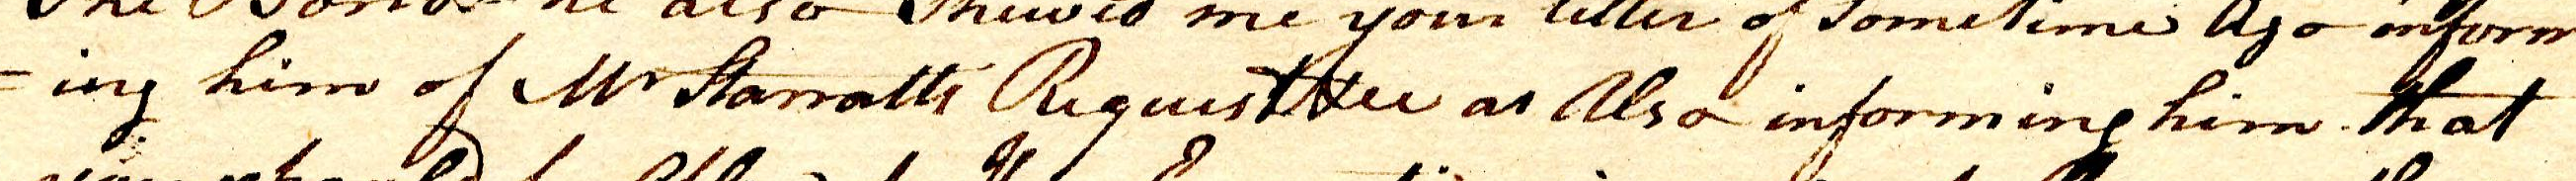-ing him of M^r. Starralls Requestee as Also informing him that
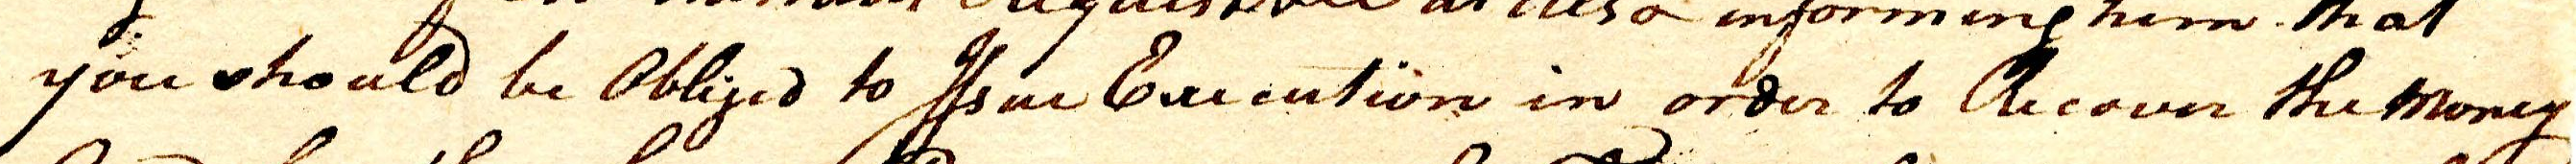you should be Obliged to Issue Execution in order to Recover the Money,
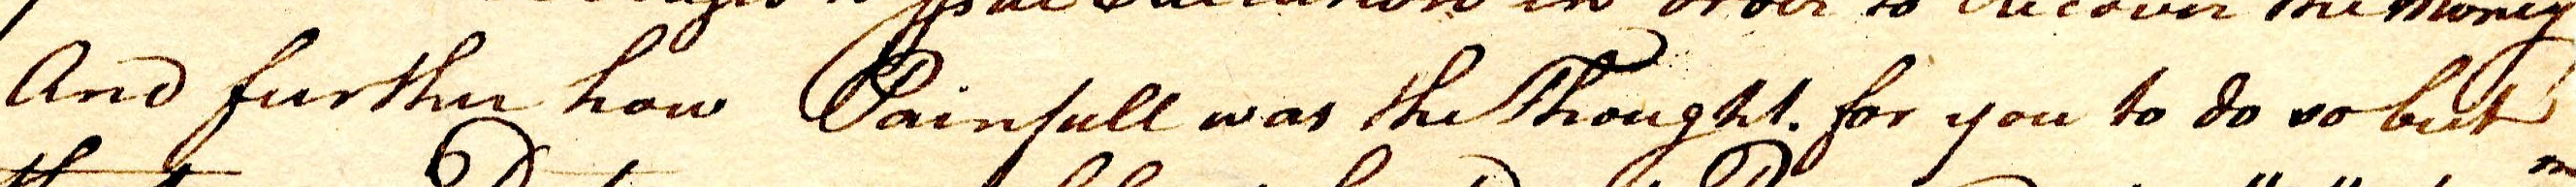and further how Painfull was the Thought for you to do so but
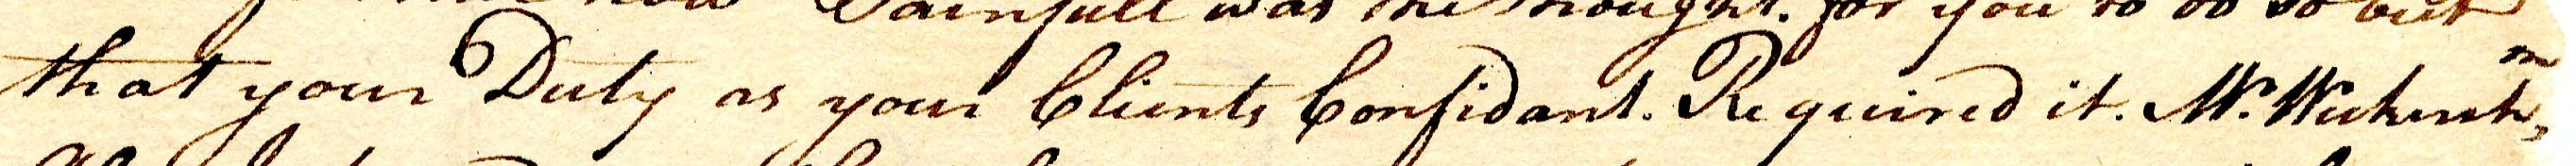that your Duty as your Clients Confidant. Required it M^r. Wickersh^am
